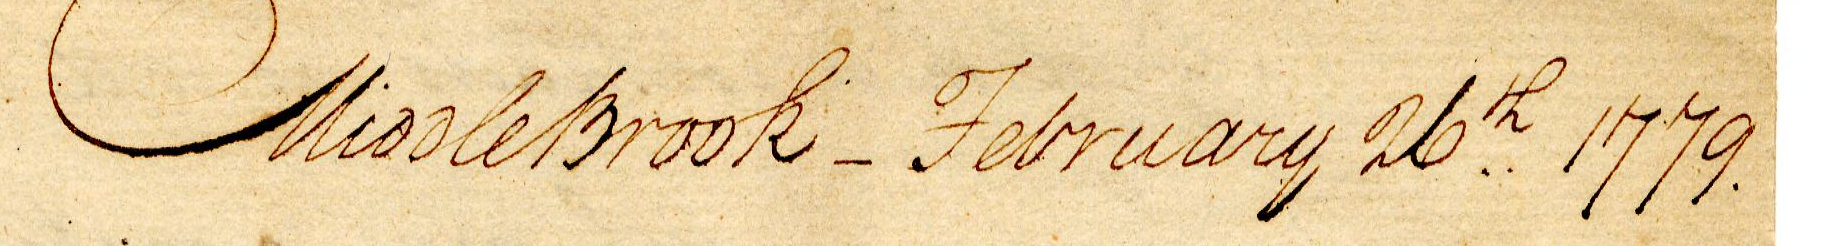MiddleBrook- February 26^th. 1779.
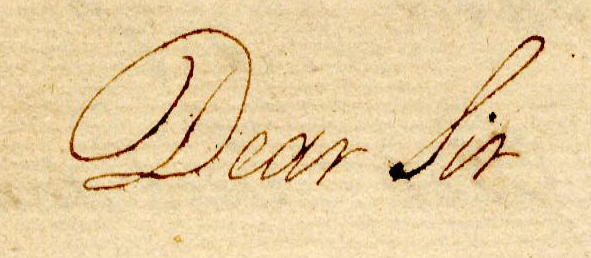Dear Sir
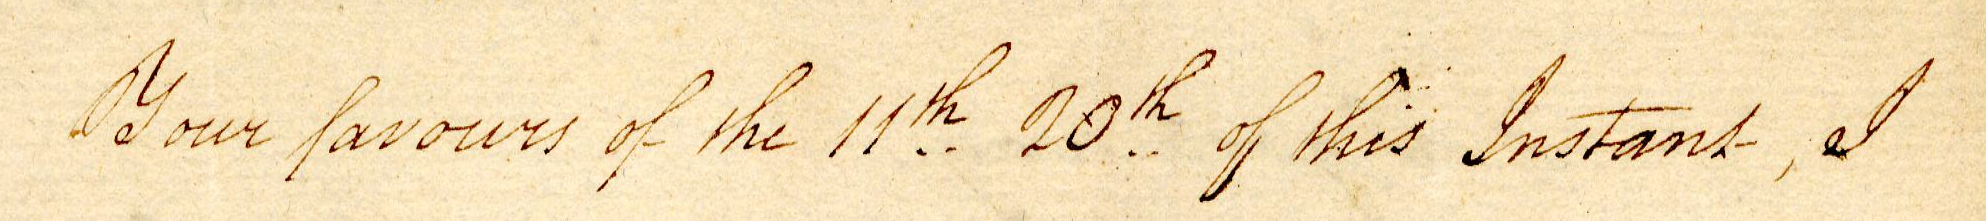Your favours of the 11^th. 20^th. of this Instant, I
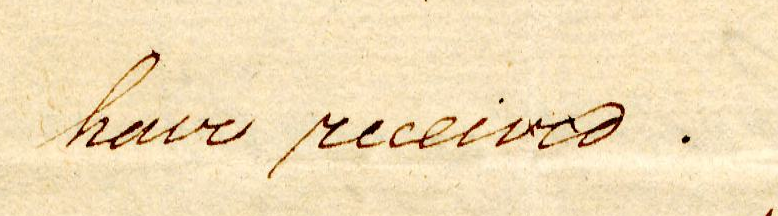have received.
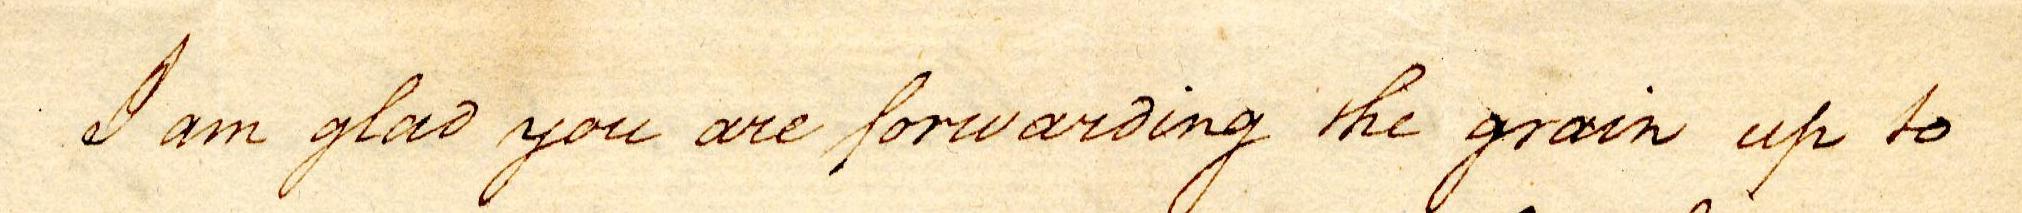I am glad you are forwarding the grain up to
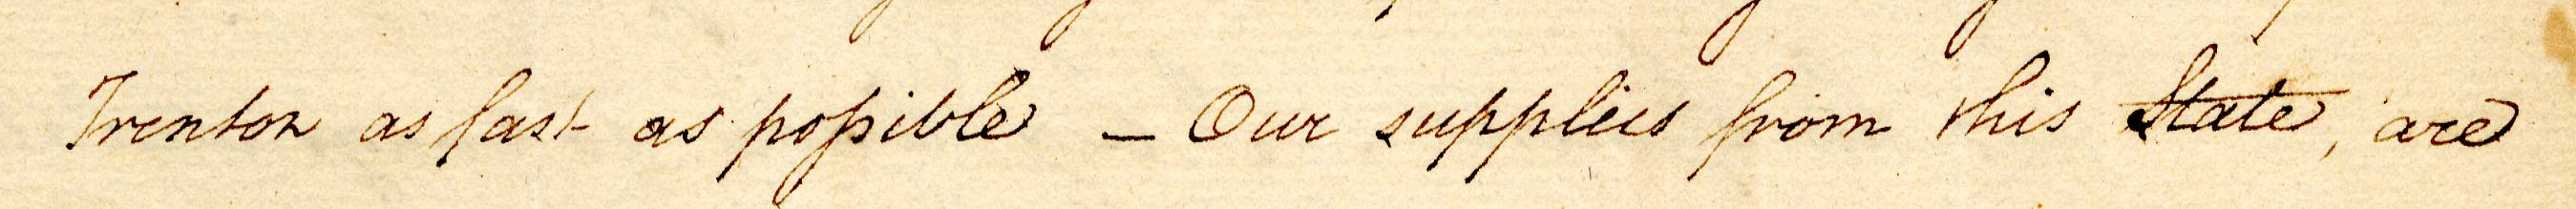Trenton as fast as possible- Our supplies from this State are
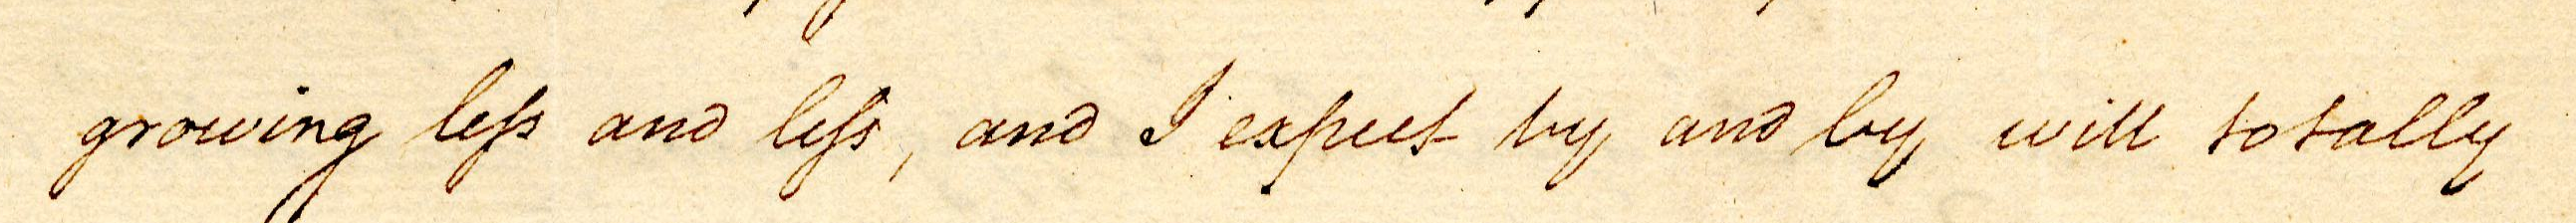growing less and less, and I expect by and by will totally
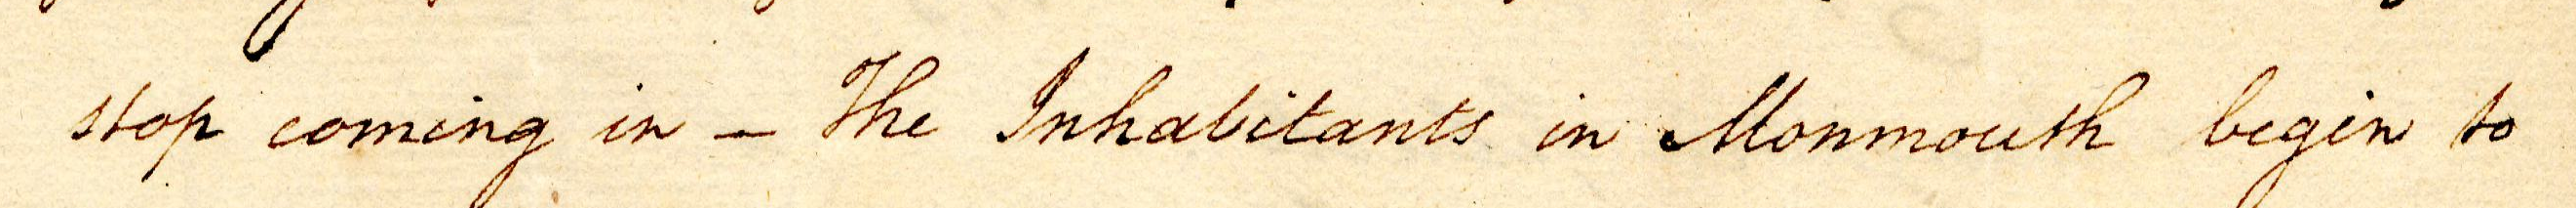stop coming in- The Inhabitants in Monmouth begin to
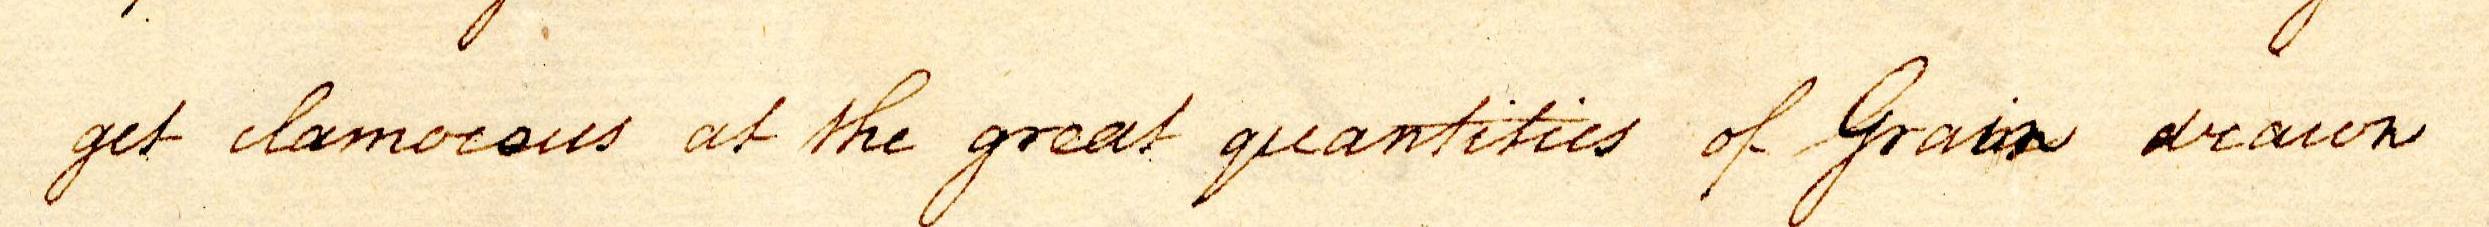get clamorous at the great quantities of Grain drawn
